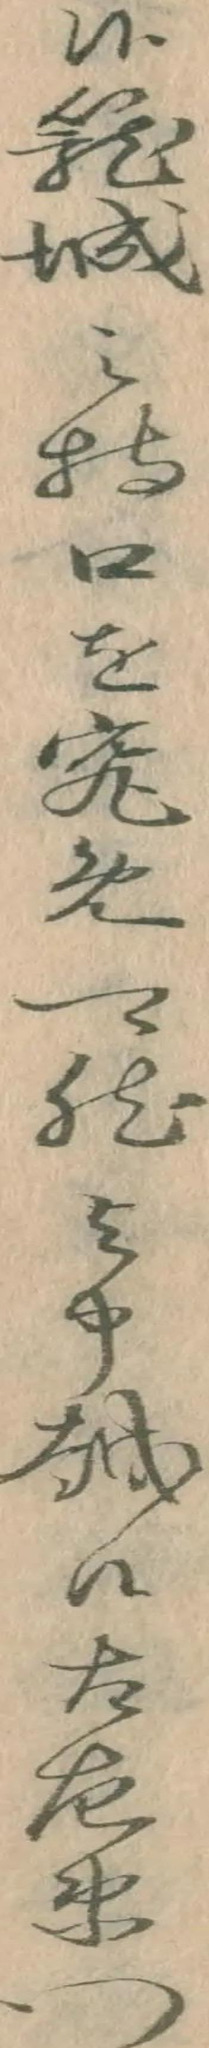候籠城之持口を究免可然与申越候太左衛門

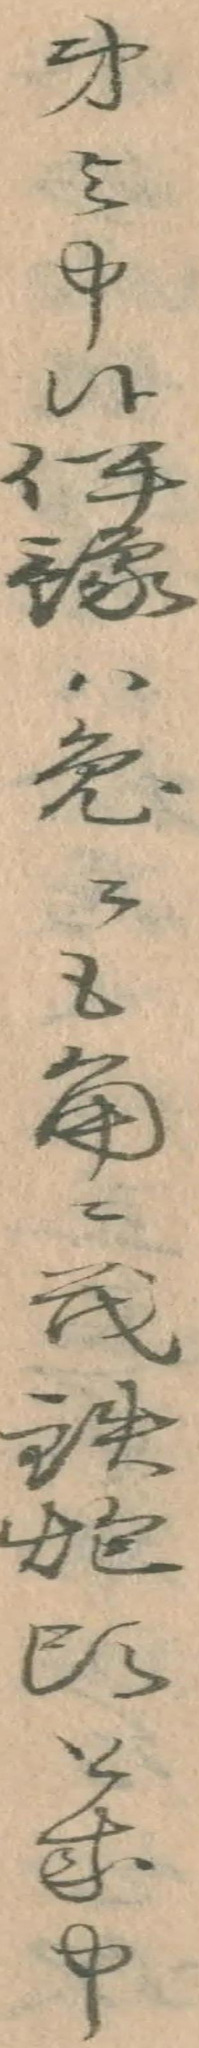弟与申候伊予は兎にも角に茂鉄炮頭と成申
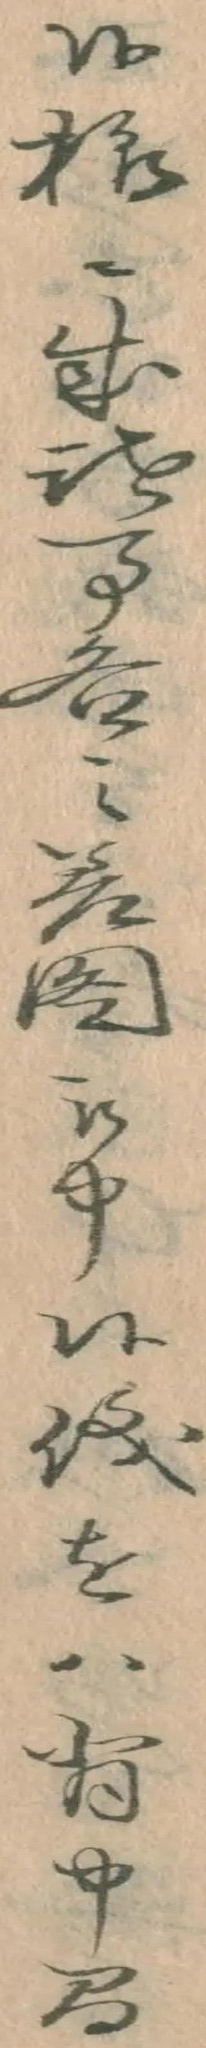候様に成諸事各之差図被申候儀をは背申間
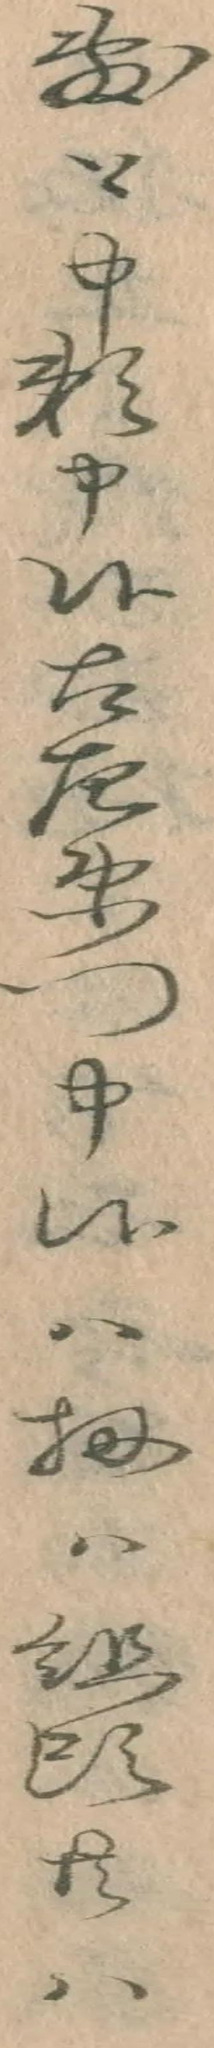敷と申頼申候太左衛門申候は扨は組頭共は
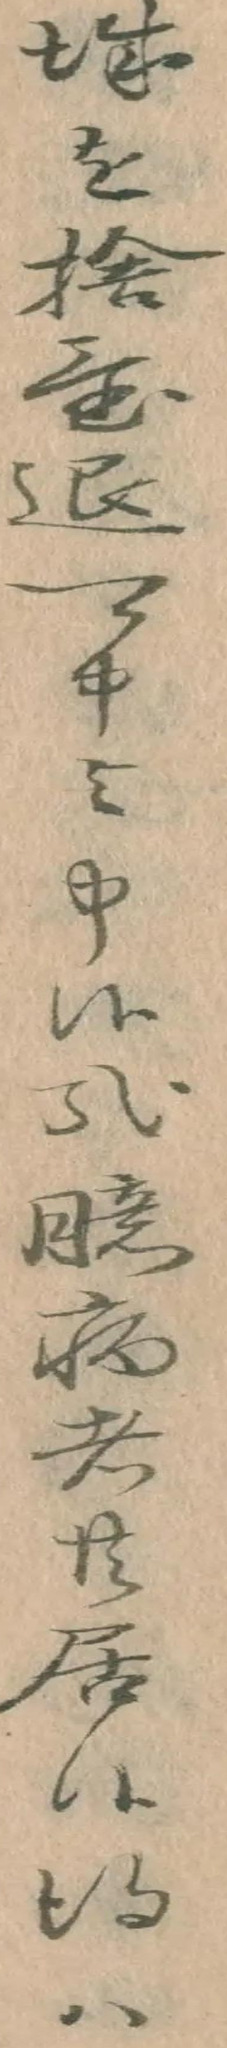城を捨置退可申与申候哉臆病者共居候得は
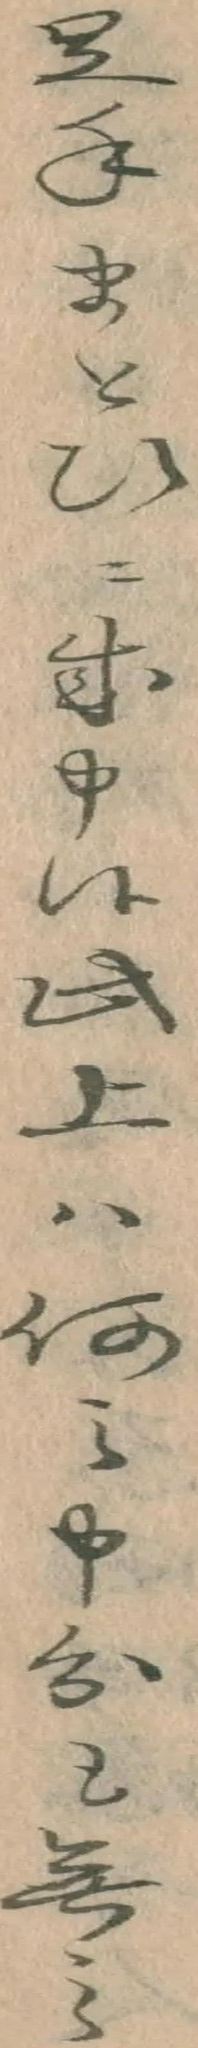足手まとひに成申候此上は何ら申分も無之
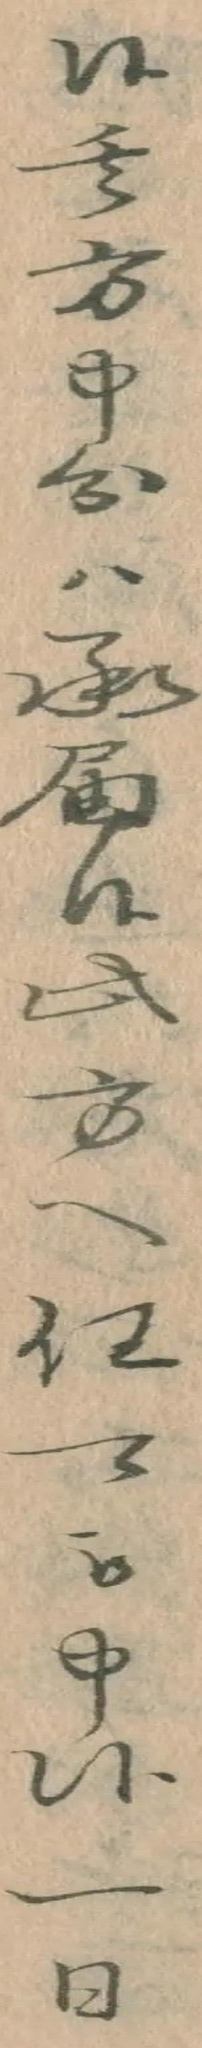候其方申分は承届候此方へ任可被申候一日
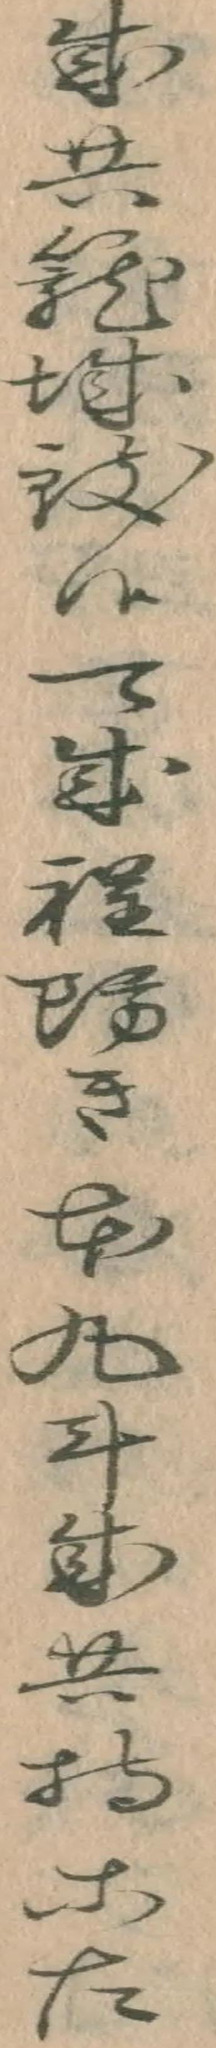成共籠城致候て成程防き本丸斗成共持古た
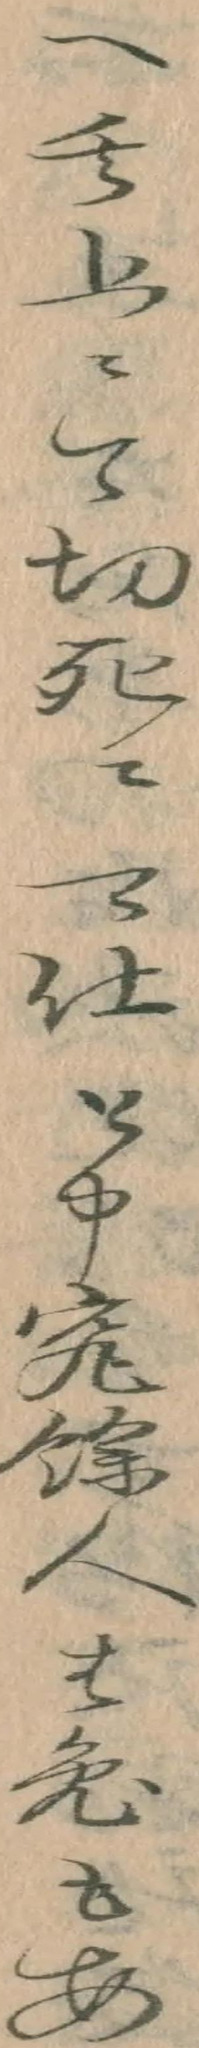へ其上にて切死に可仕と申究余人は兎もあ
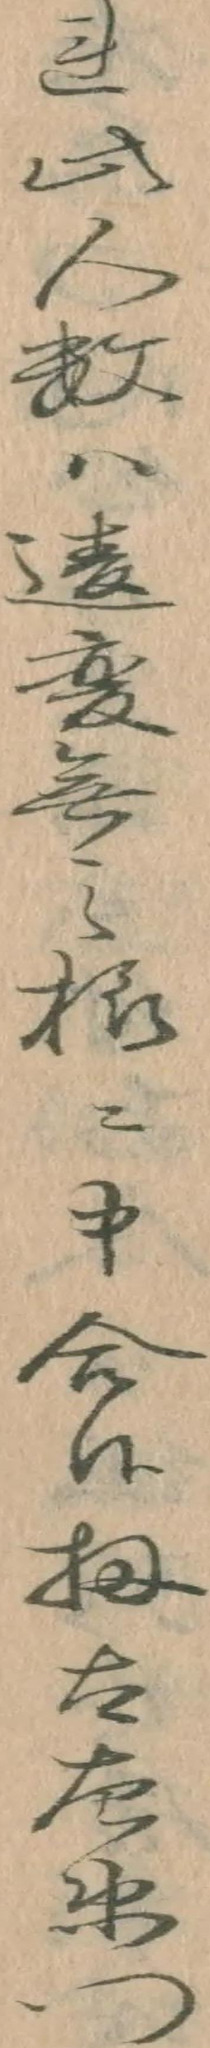連此人数は違変無之様に申合候扨太左衛門
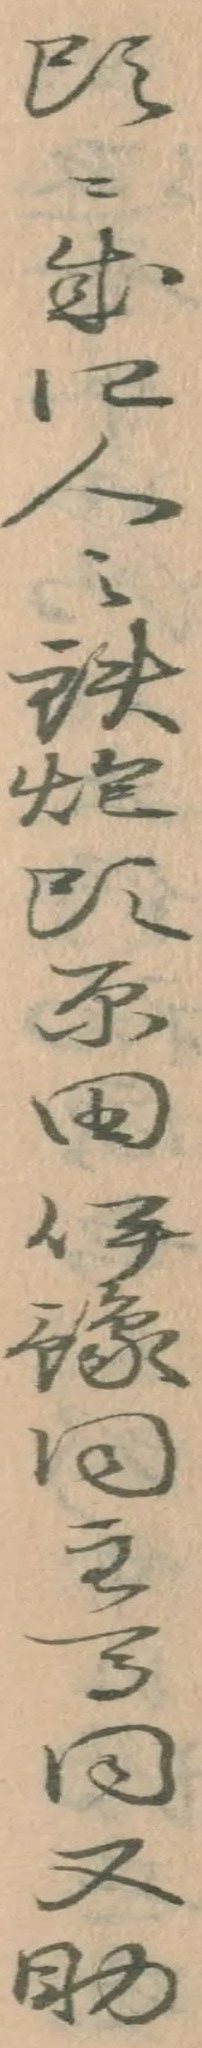頭に成四人之鉄炮頭原田伊予同主馬同又助
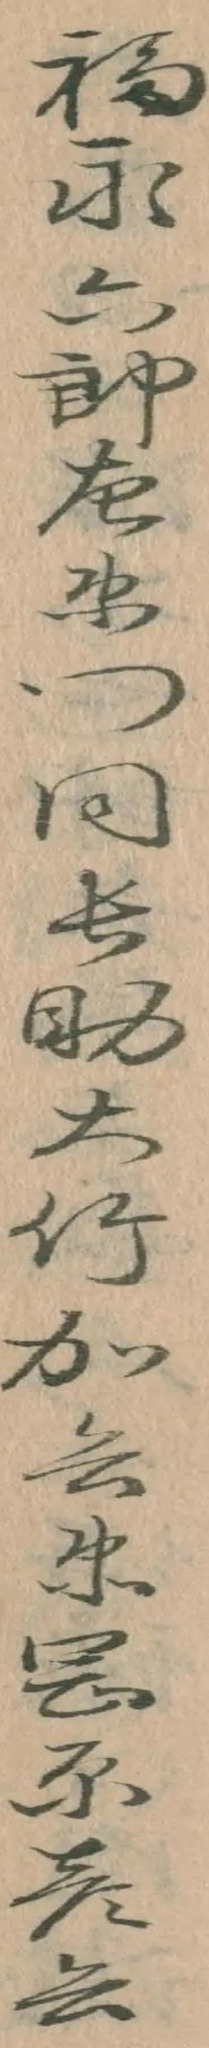福永六郎左衛門同長助大竹加兵衛岡原彦兵
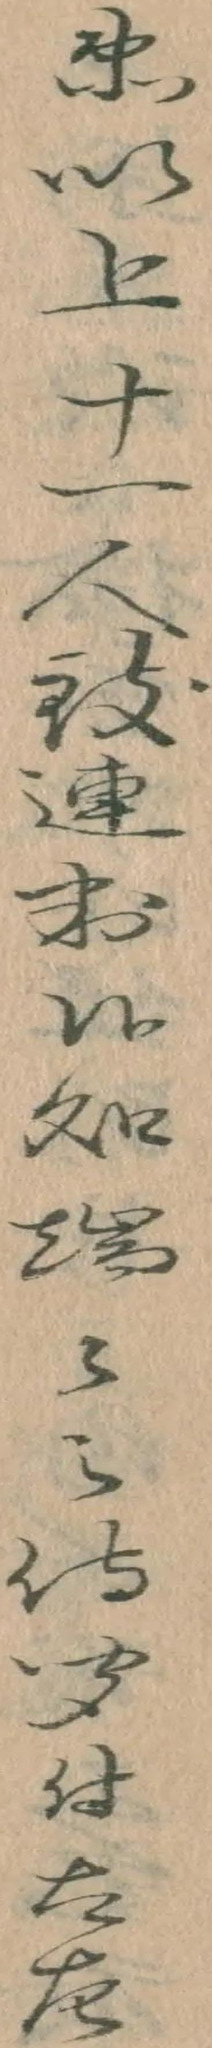衛以上十一人致連判候処端々之侍聞付太左
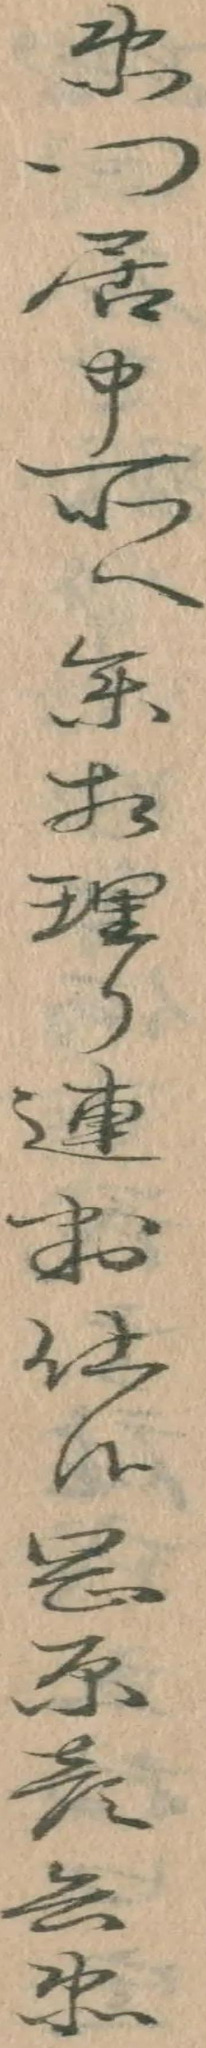衛門居申所へ参相理り連判仕候岡原彦兵衛
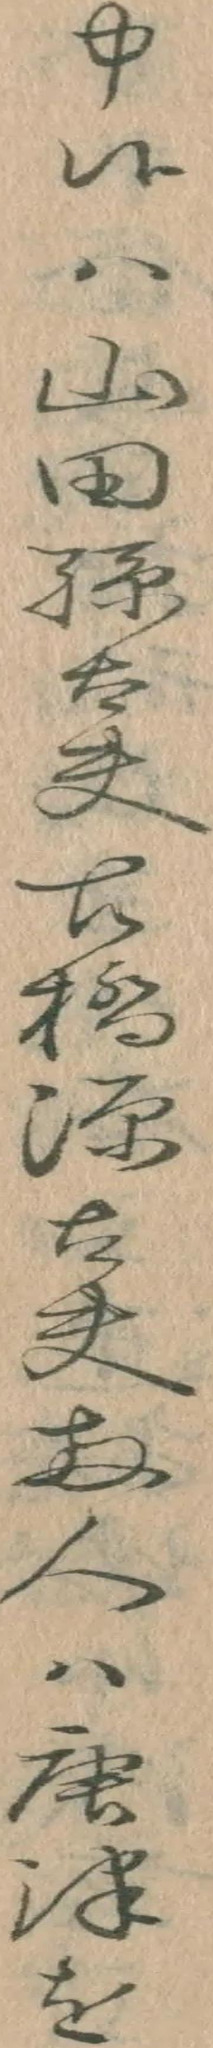申候は山田孫太夫古橋源太夫両人は唐津を
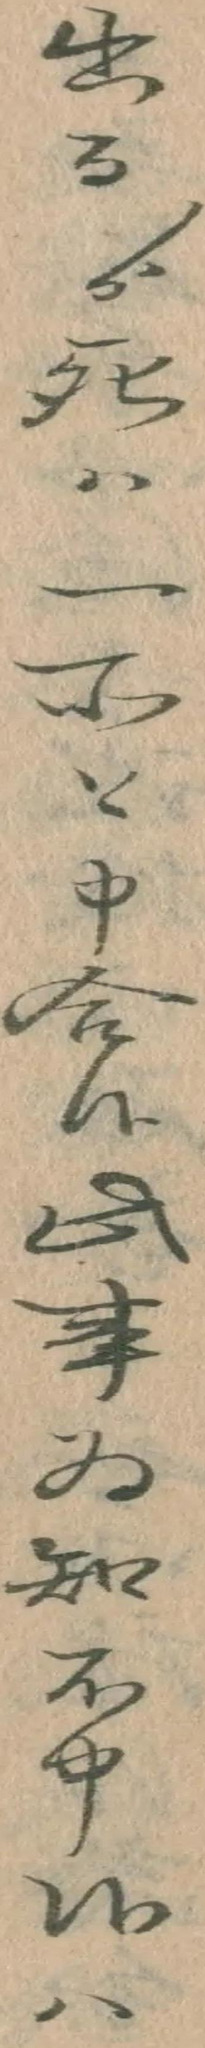出るゟ死は一所と申合候此事ゐ知不申候は
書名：切支丹御退治記 49巻. [2]
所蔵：国立国会図書館 National Diet Library, JAPAN
